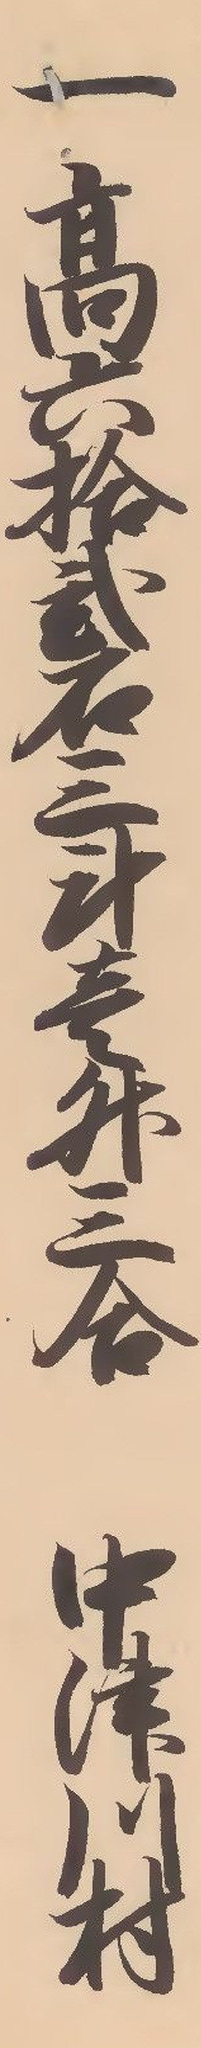一高六拾弐石三斗壱升三合中津川村
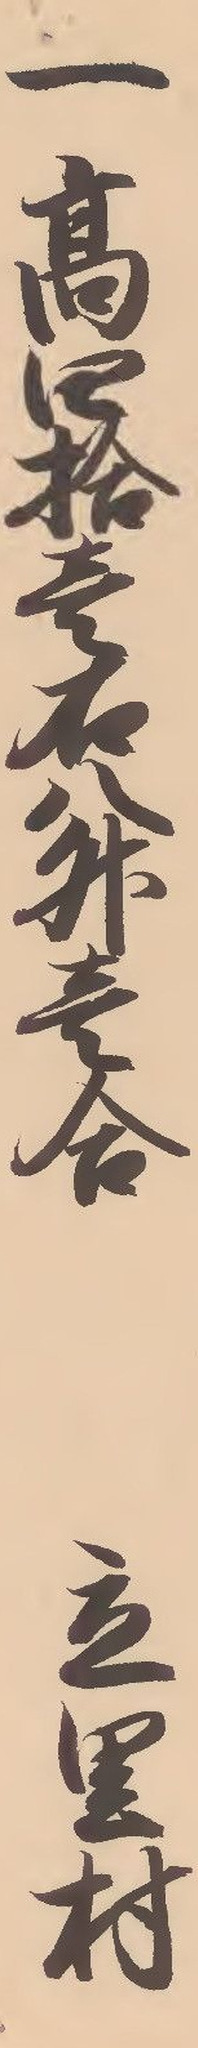一高四拾壱石八升壱合立里村
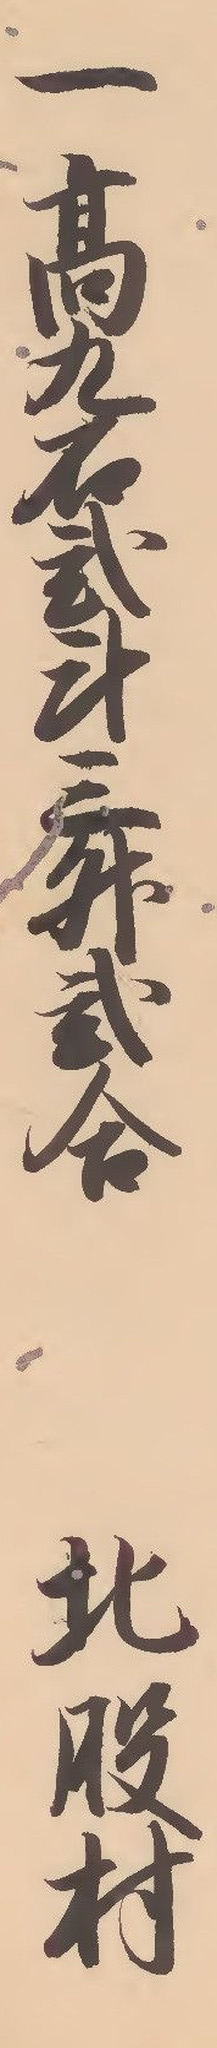一高九石弐斗三升弐合北股村

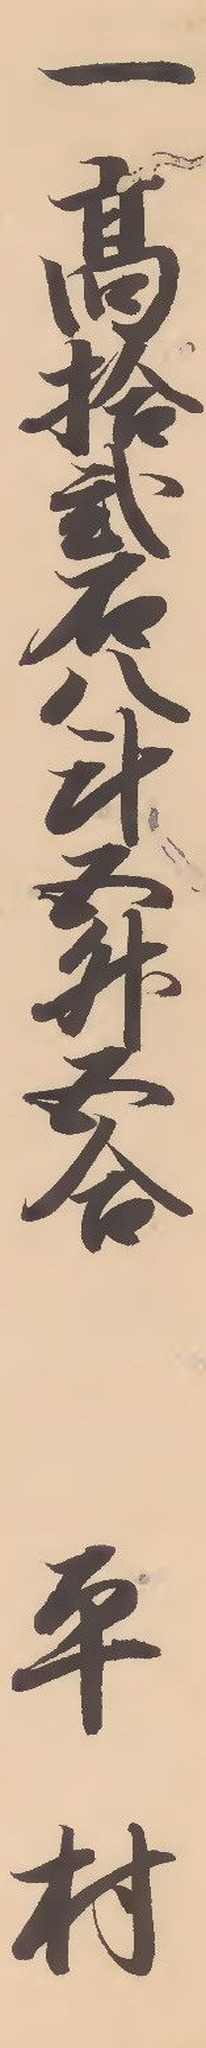一高拾弐石八斗五升五合平村
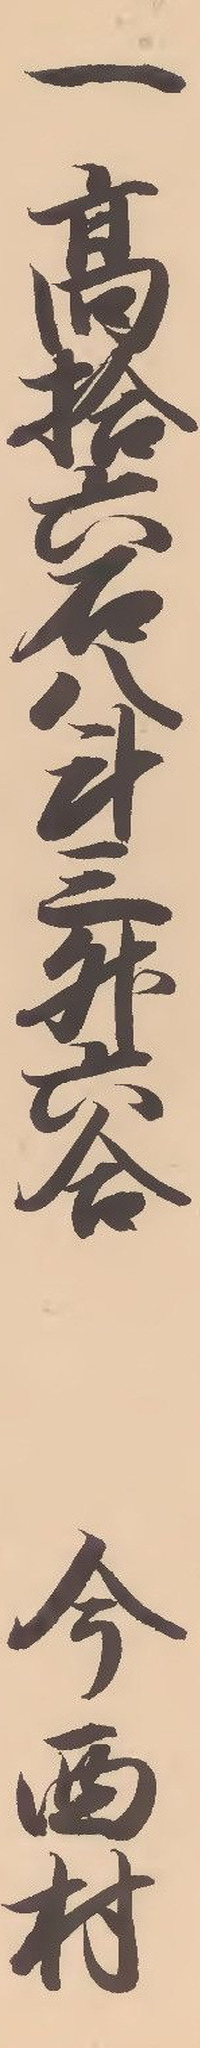一高拾六石八斗三升六合今西村
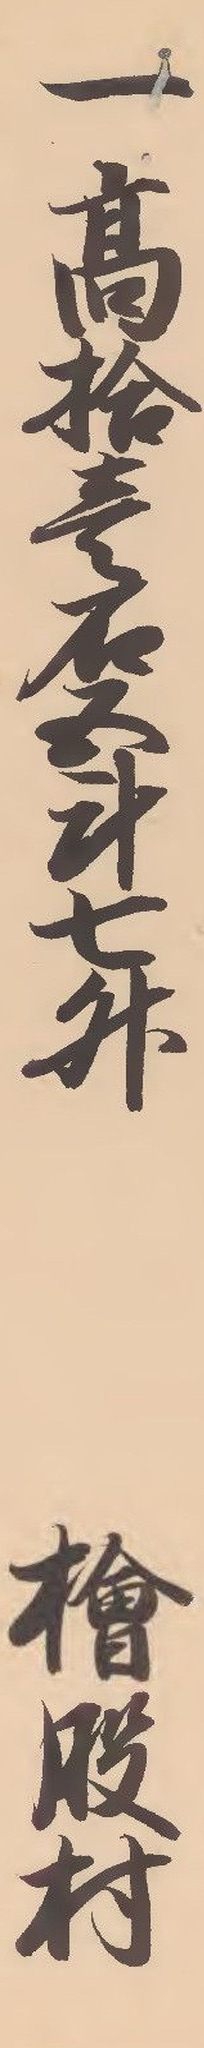一高拾壱石五斗七升桧股村
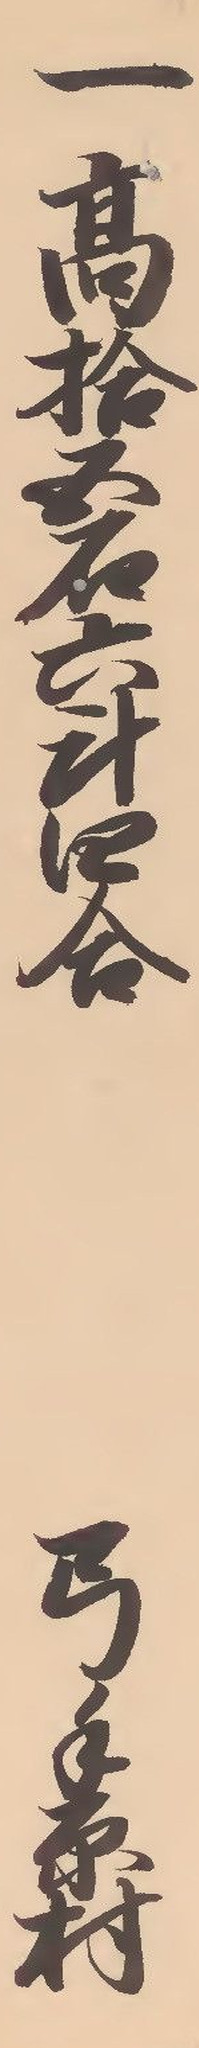一高拾五石六斗四合弓手原村
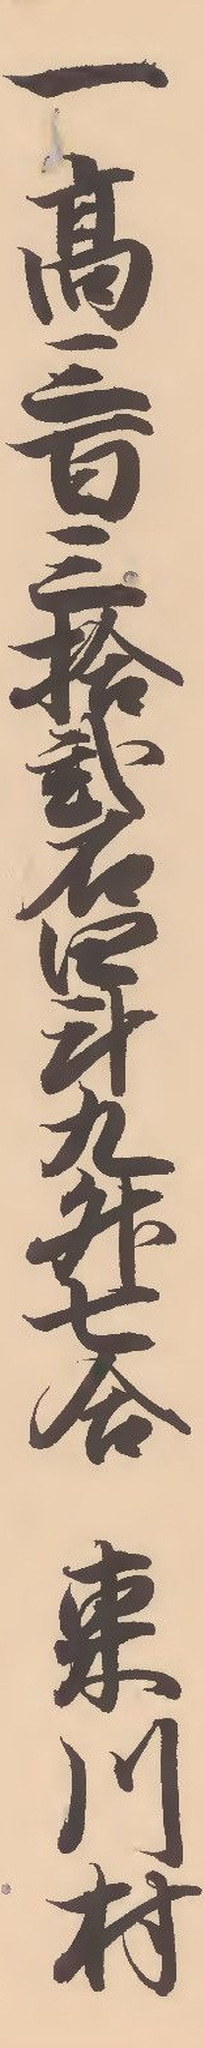一高三百三拾弐石四斗九升七合東川村
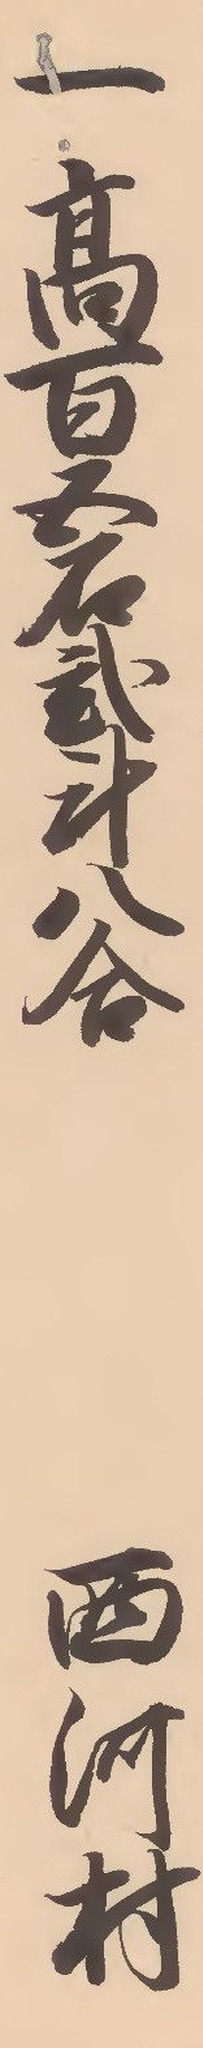一高百五石弐斗八合西河村
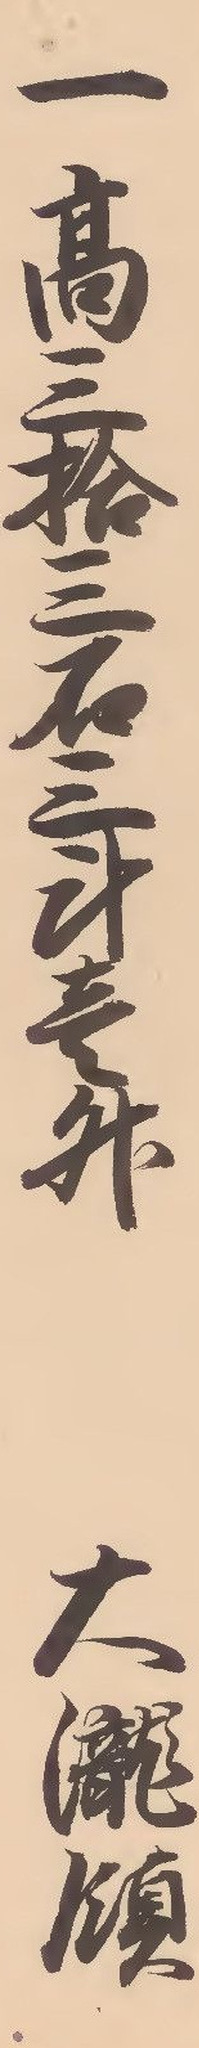一高三拾三石三斗壱升大滝領
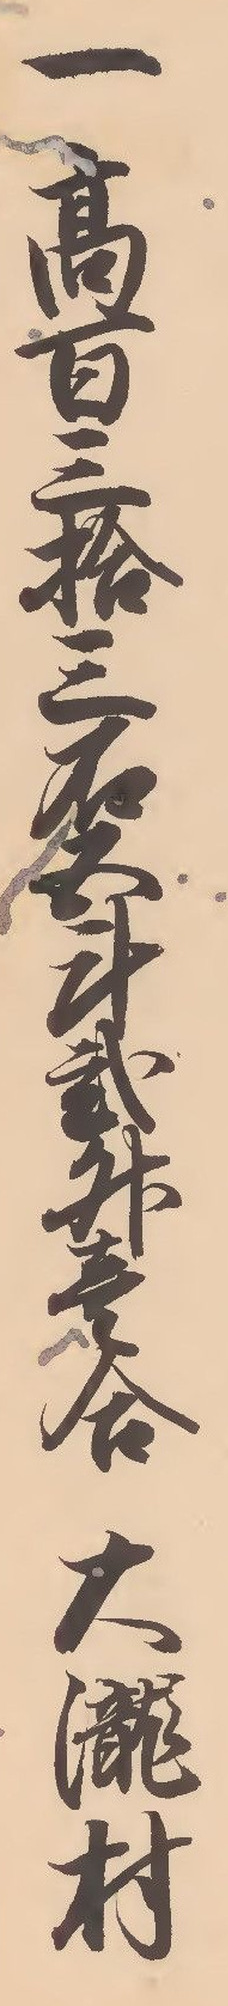一高百三拾三石五斗弐升壱合大滝村

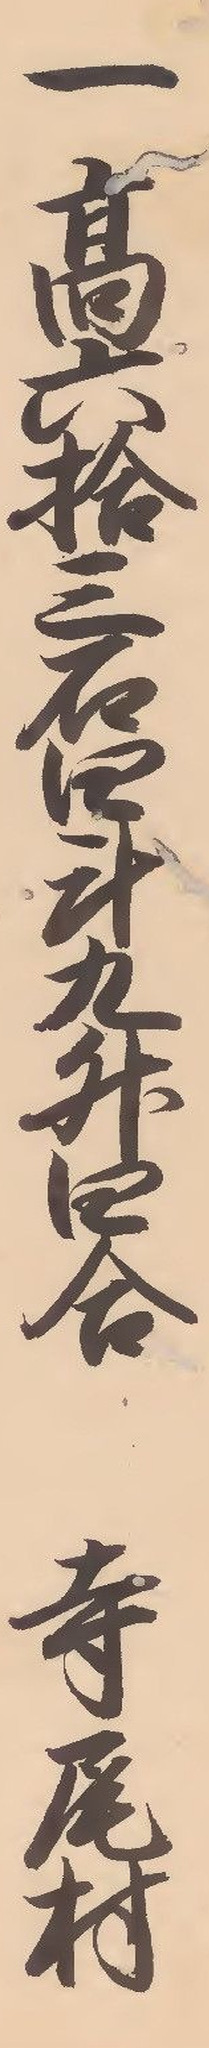一高六拾三石四斗九升四合寺尾村
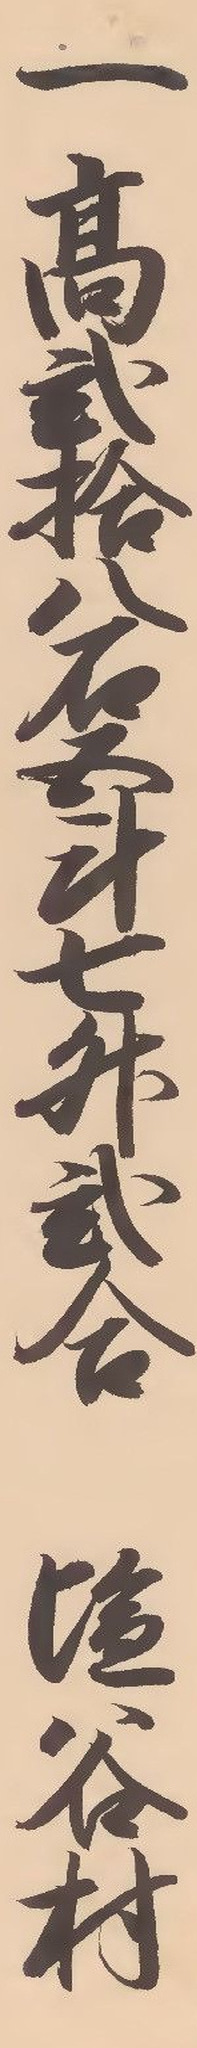一高弐拾八石五斗七升弐合塩谷村
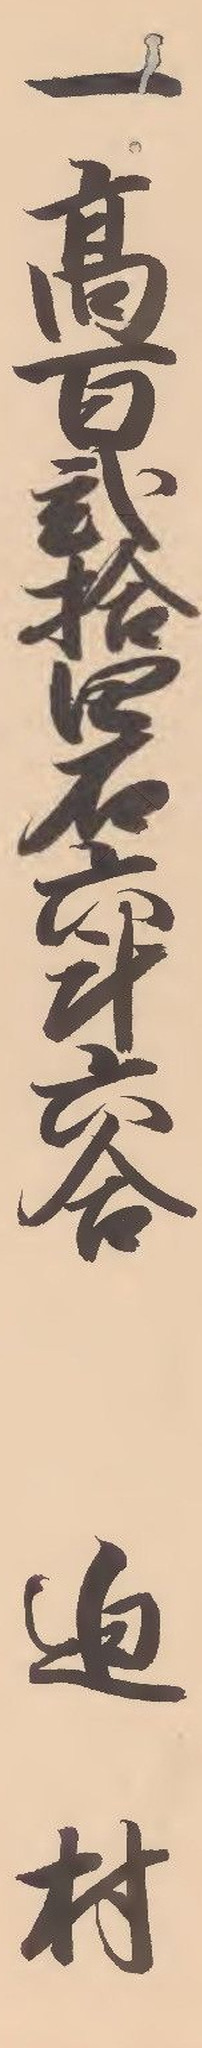一高百弐拾四石六斗六合迫村
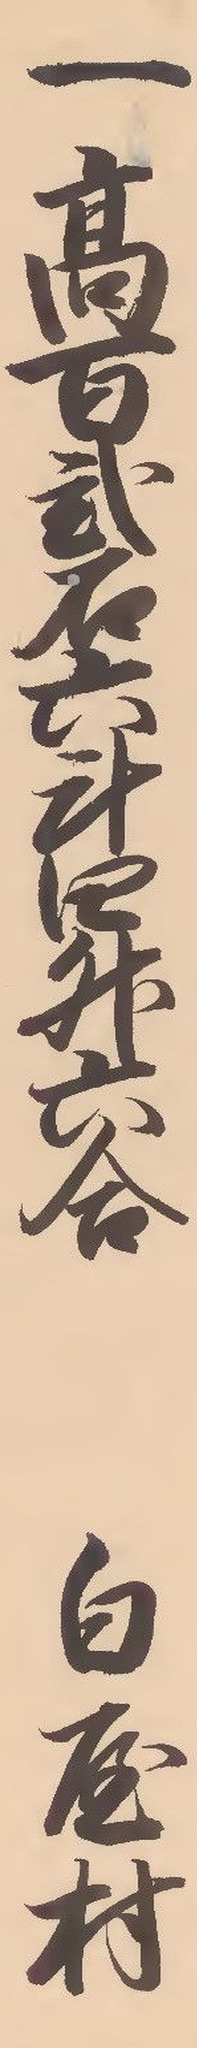一高百弐石六斗四升六合白屋村
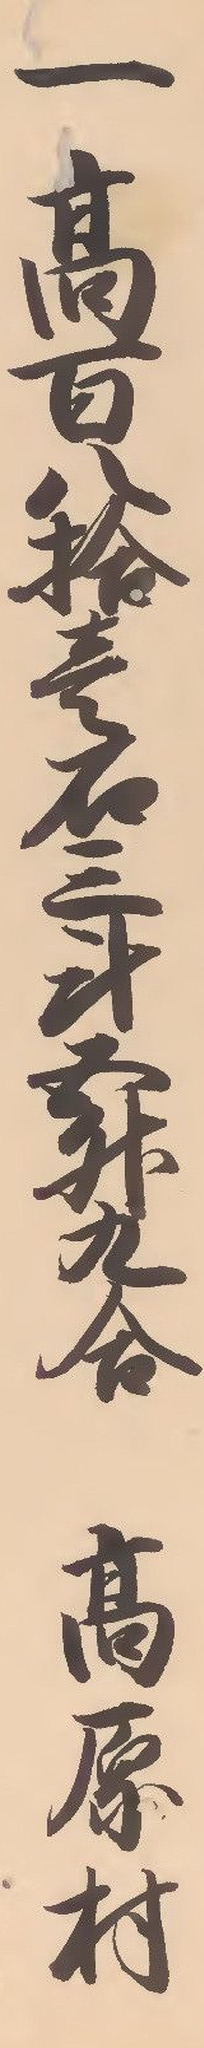一高百八拾壱石三斗五升九合高原村
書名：大和国郷帳
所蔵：国立公文書館 National Archives of Japan
